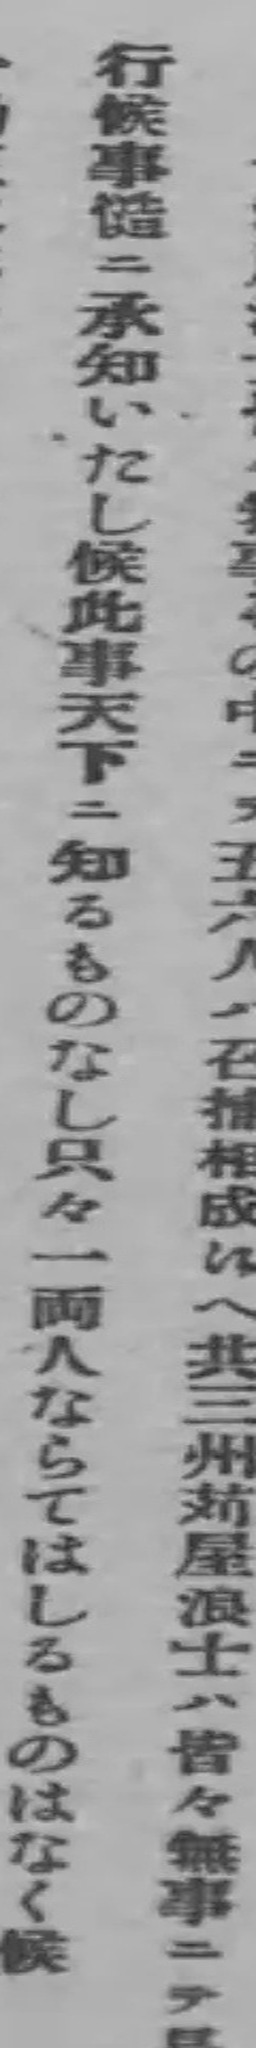行候事慥ニ承知いたし候此事天下ニ知るものなし只々一両人ならてはしるものはなく候
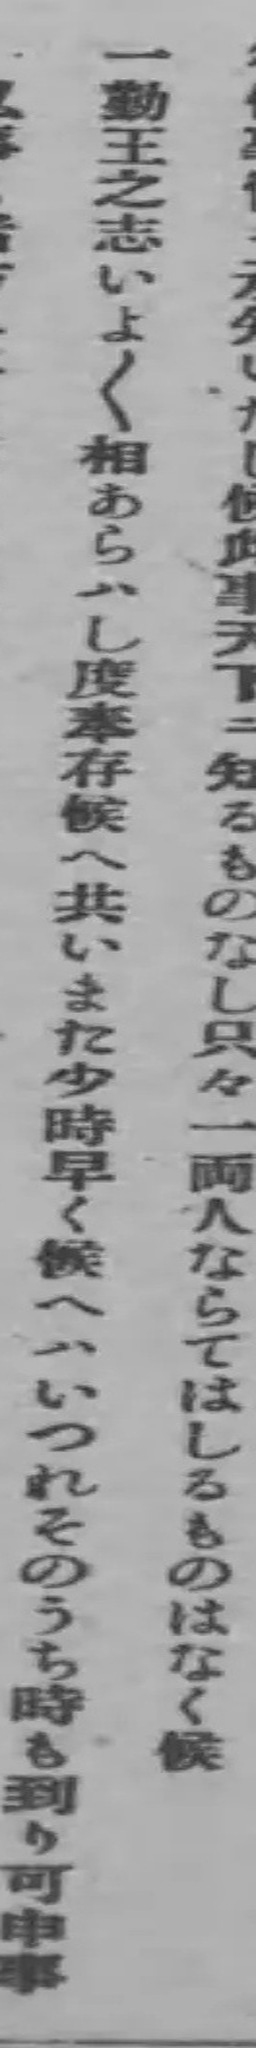一勤王之心いよ〳〵相あらハし度奉存候へ共いまた少時早く候へハいつれそのうち時も到り可申事
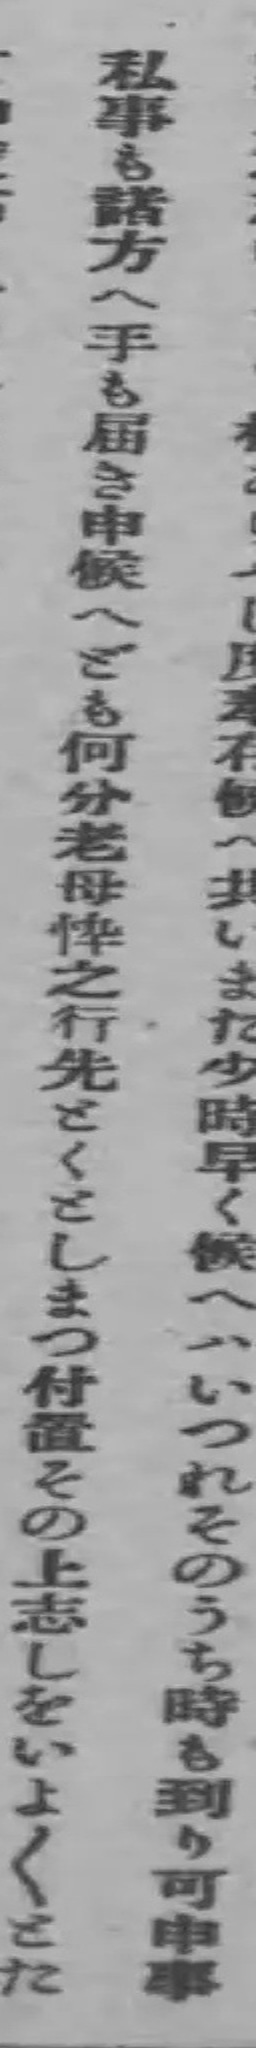私事も諸方へ手も届き申候ヘども何分老母忰之行先とくとしまつ付置その上志しをいよ〳〵とた
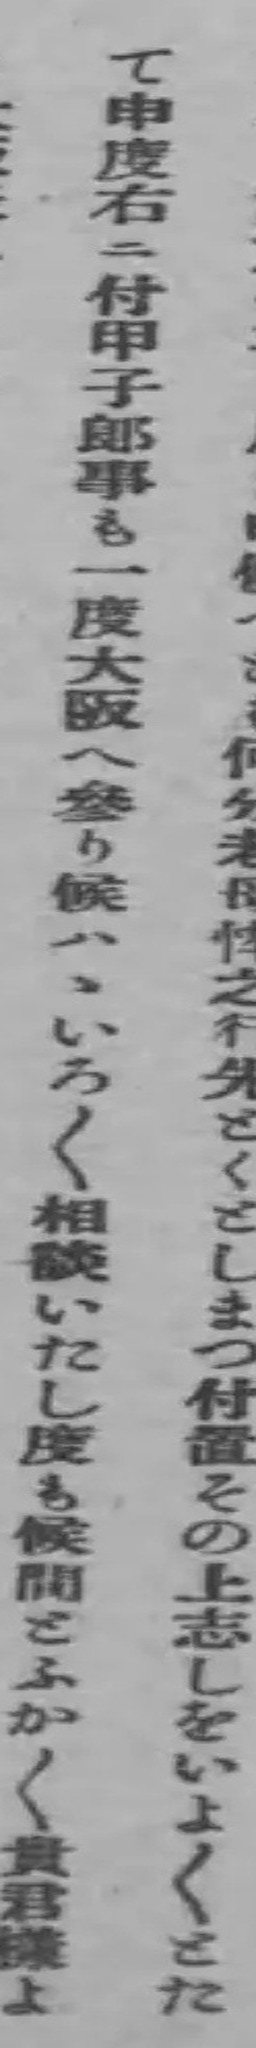て申度右ニ付甲子郎事も一度大阪へ参り候ハゝいろ〳〵相談いたし度も候間とふか〳〵貴君様よ
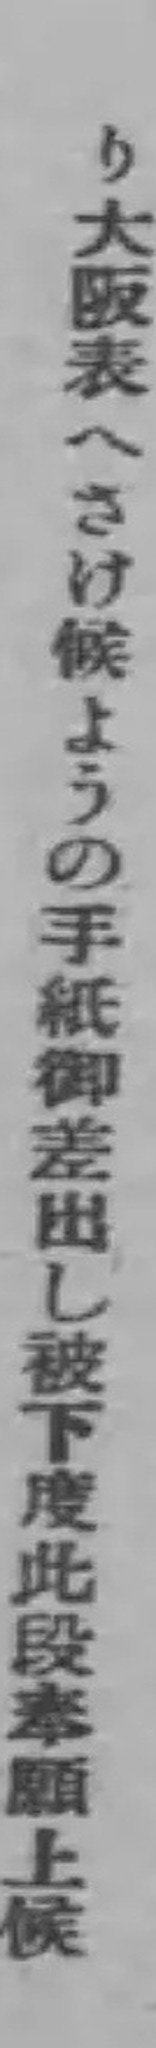り大阪表へさけ候ようの手紙御差出し被下度此段奉願上候
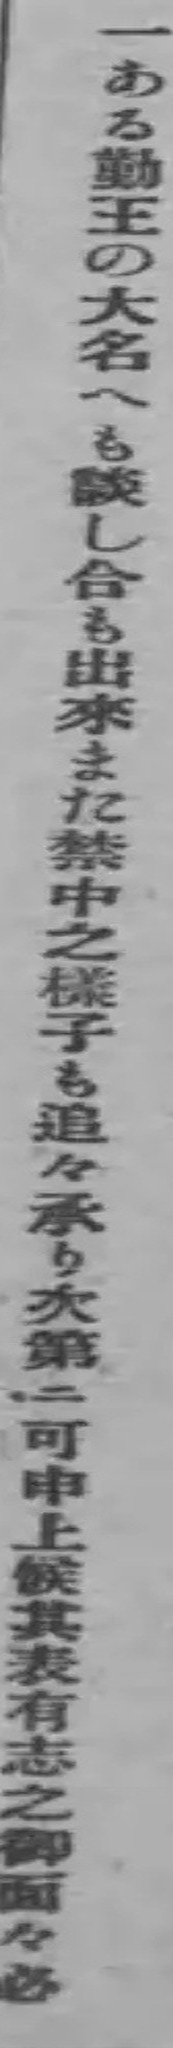一ある勤王の大名へも談し合も出来また禁中之様子も追々承り次第ニ可申上候其表有志之御面々必
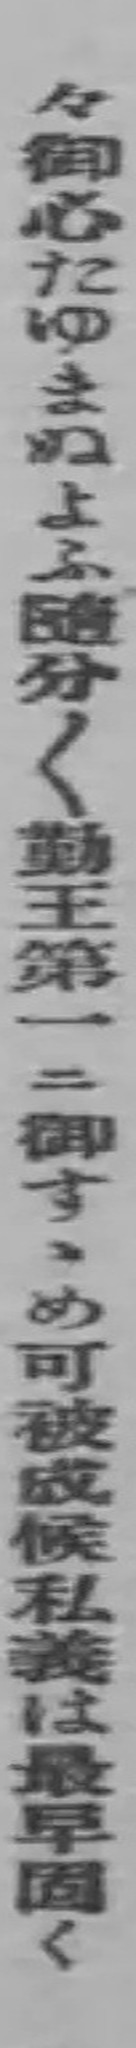々御心たゆまぬよふ随分〳〵勤王第一ニ御すゝめ可被成候私義は最早固く
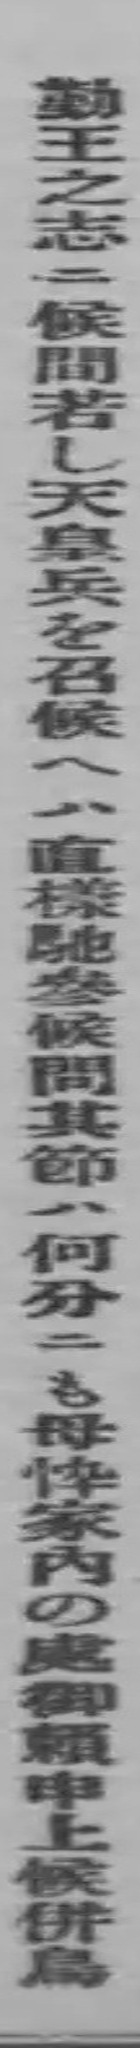勤王之志ニ候間若し天皇兵を召候ヘハ直様馳参候間其節ハ何分ニも母忰家内の処御頼申上候併鳥
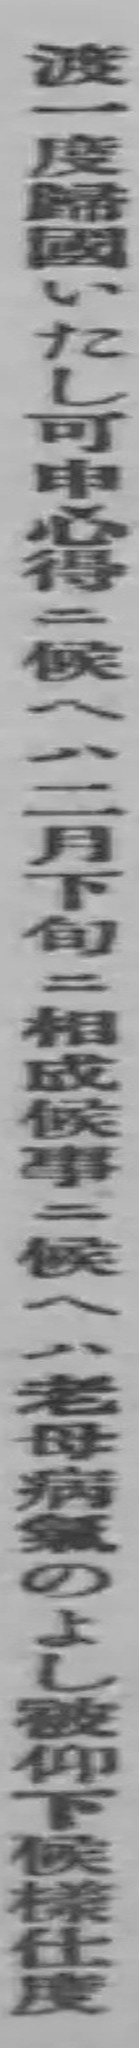渡一度帰国いたし可申心得ニ候へハ二月下旬ニ相成候事ニ候へハ老母病気のよし被仰下候様仕度
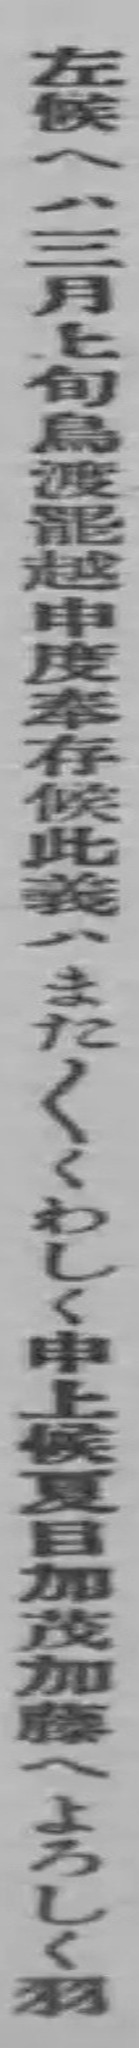左候へハ三月上旬鳥渡罷越申度奉存候此義ハまた〳〵くわしく申上候夏目加茂加藤へよろしく羽
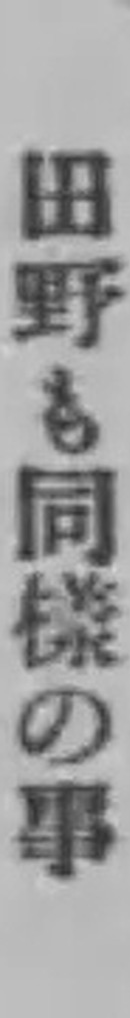田野も同様の事
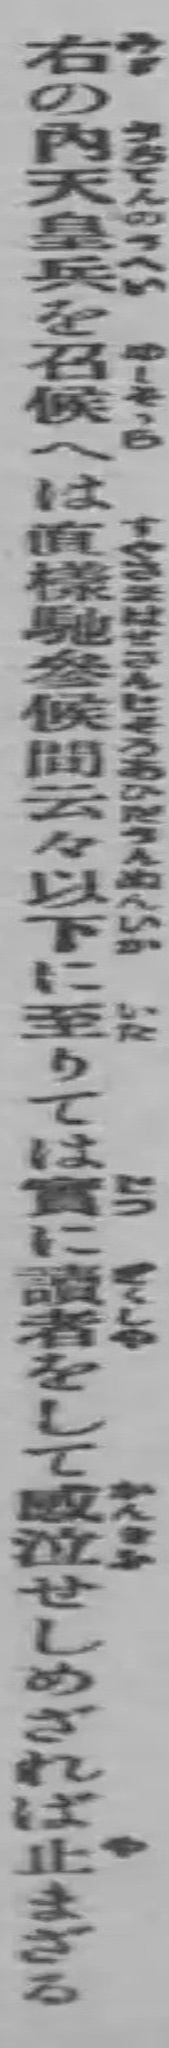右の内天皇兵を召候へは直様馳参候間云々以下に至りては実に読者をして感泣せしめざれば止まざる
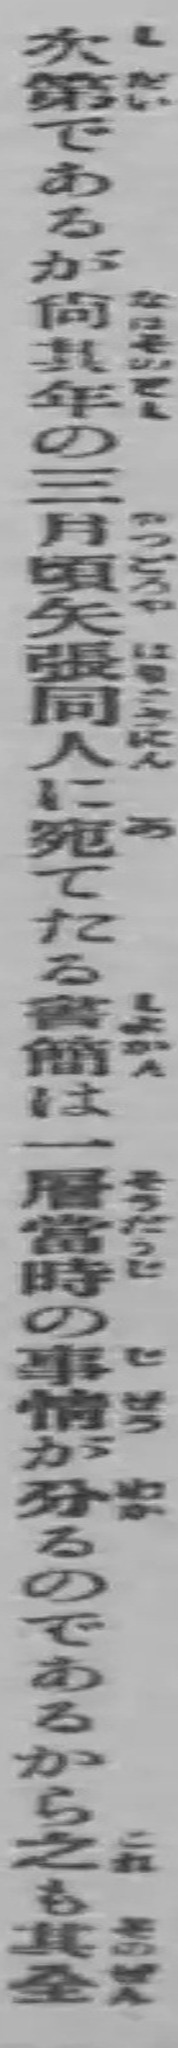次第であるが尚其年の三月頃矢張同人に宛てたる書簡は一層当時の事情が分るのであるから之も其全
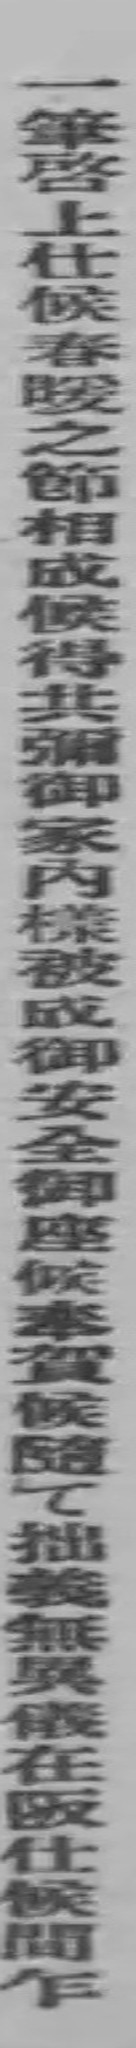一筆啓上仕候春暖之節相成候得共彌尾家内様被成御安全御座候奉賀候随て拙義無異儀在阪仕候間乍
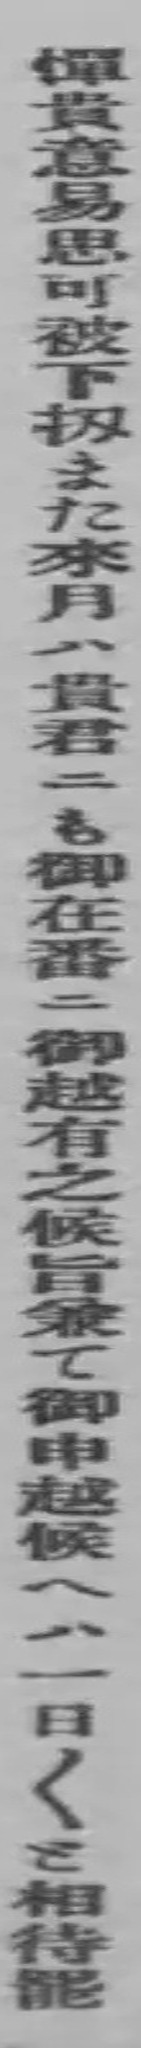憚貴意易思可被下扨また来月ハ貴君ニも御在番ニ御越有之候旨兼て御申越候へハ一日〳〵と相待罷
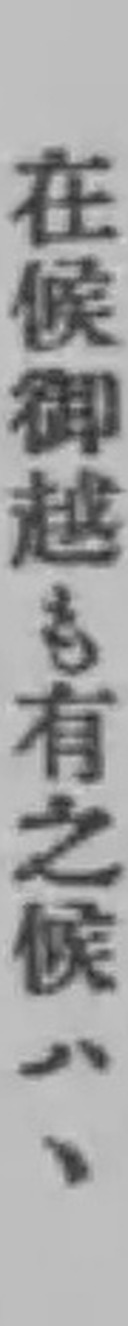在候御越も有之候ハヽ
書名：豊橋市史談
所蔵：国立国会図書館 National Diet Library, JAPAN
